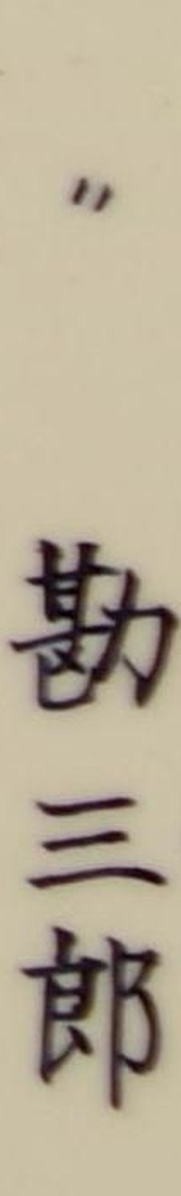勘三郎
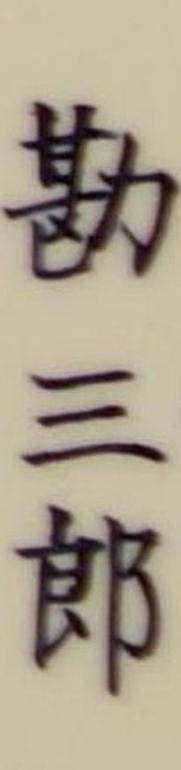勘三郎
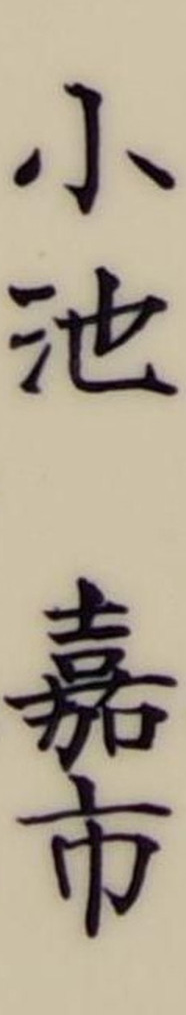小池嘉市
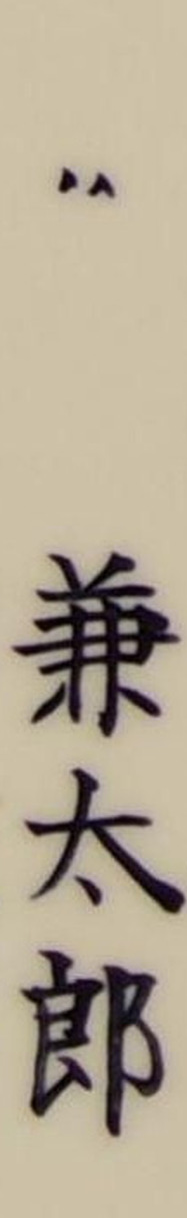兼太郎
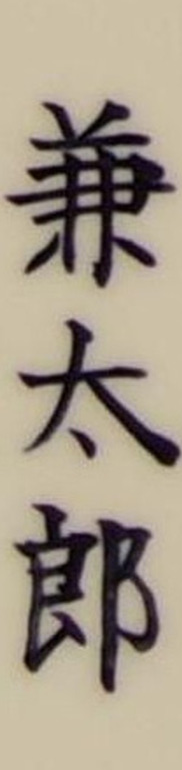兼太郎
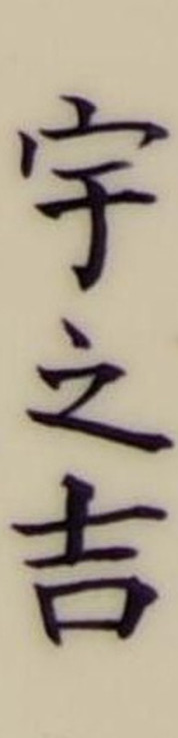宇之吉
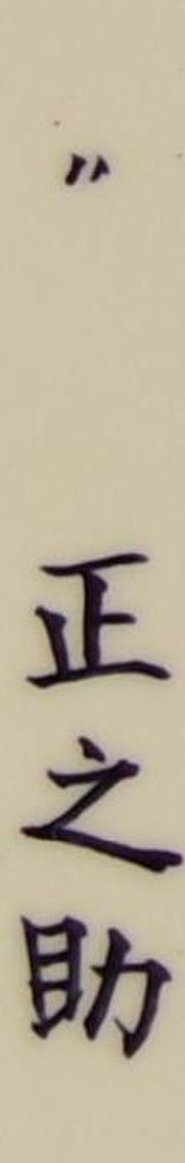正之助
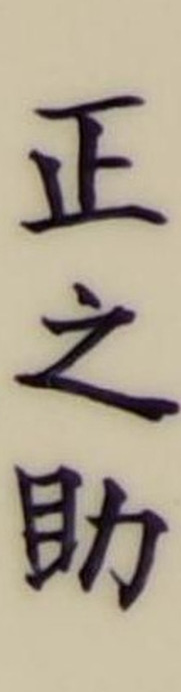正之助
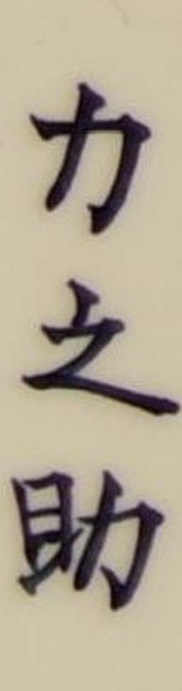力之助
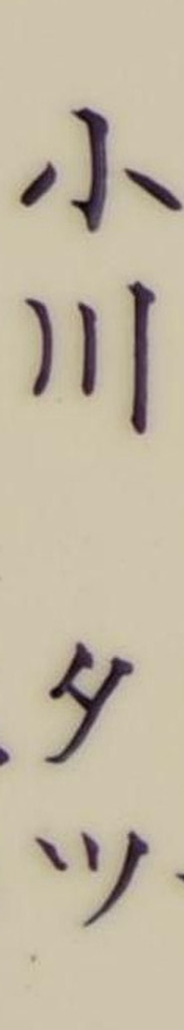小川タツ

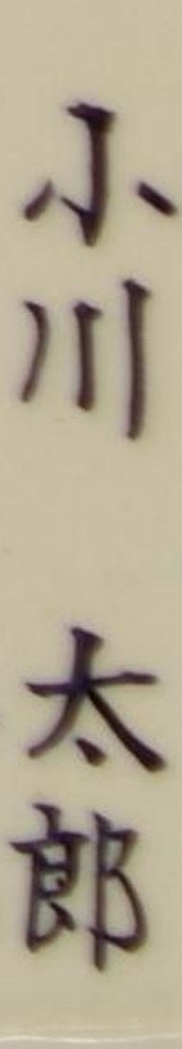小川太郎
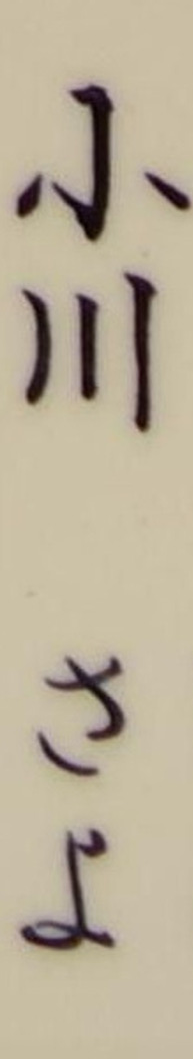小川さよ
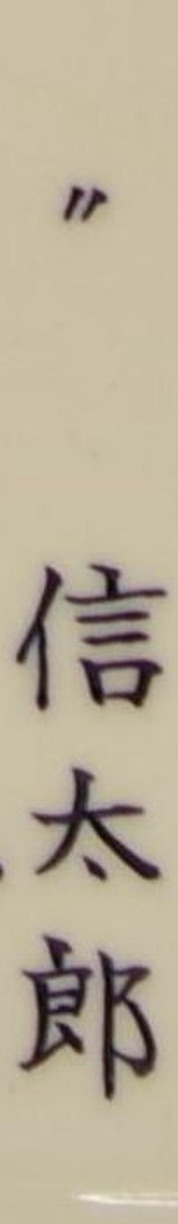信太郎
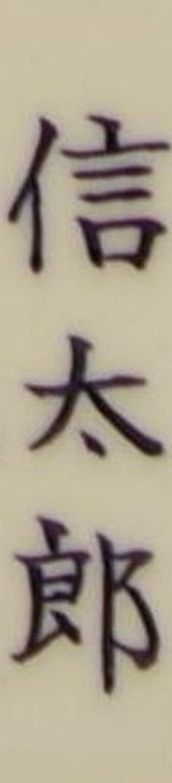信太郎
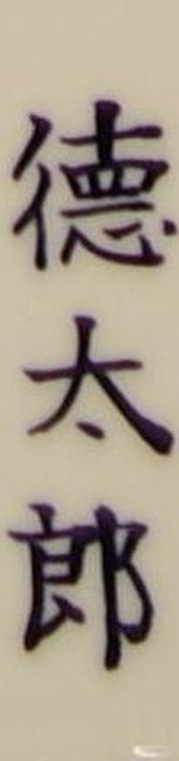徳太郎
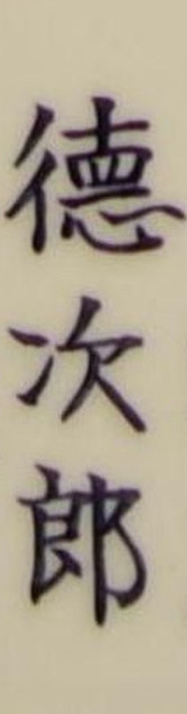徳次郎
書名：A~D
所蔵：koyasan kongobuji
